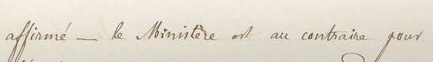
affirmé – le Ministère est au contraire pour
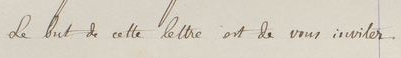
Le but de cette lettre est de vous inviter
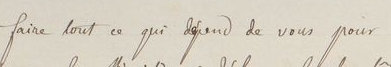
faire tout ce qui dépend de vous pour
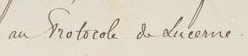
au Protocole de Lucerne.
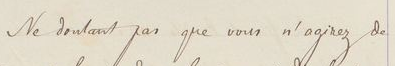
Ne doutant pas que vous n'agirez de
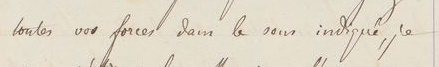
toutes vos forces dans le sens indiqué, je
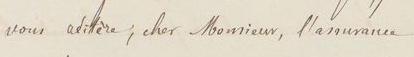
vous réitère, cher Monsieur, l'assurance
